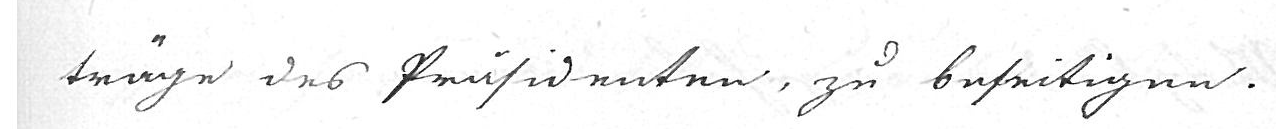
träge des Präsidenten zu beseitigen.
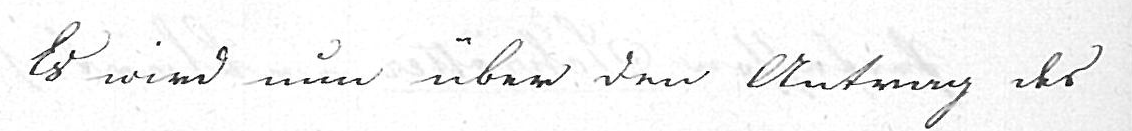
Es wird nun über den Antrag des
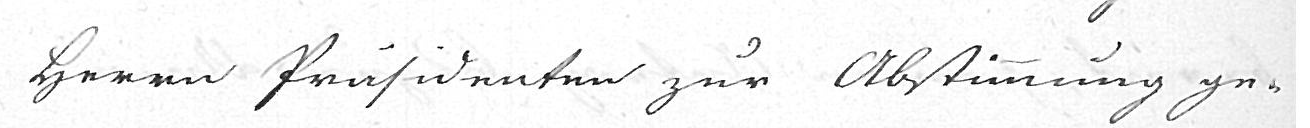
Herrn Präsidenten zur Abstimmung ge-
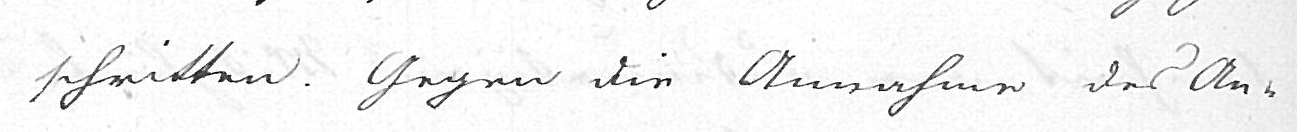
schritten. Gegen die Annahme des An-
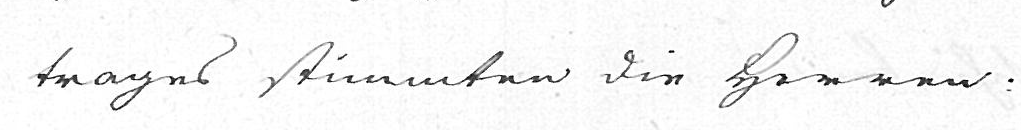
trages stimmten die Herren:
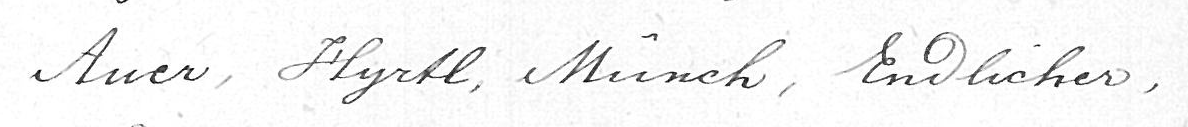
Auer, Hyrtl, Münch, Endlicher,
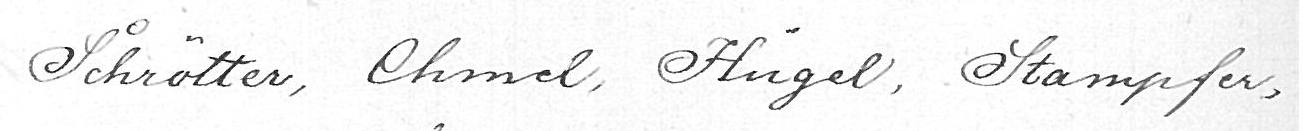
Schrötter, Chmel, Hügel, Stampfer,
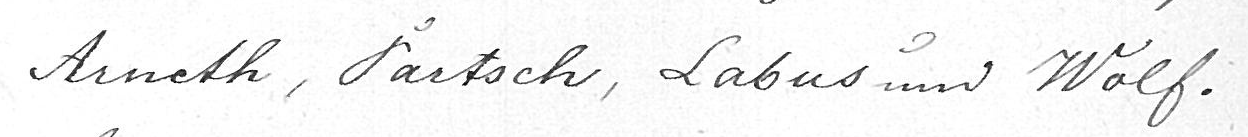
Arneth, Partsch, Labus und Wolf.
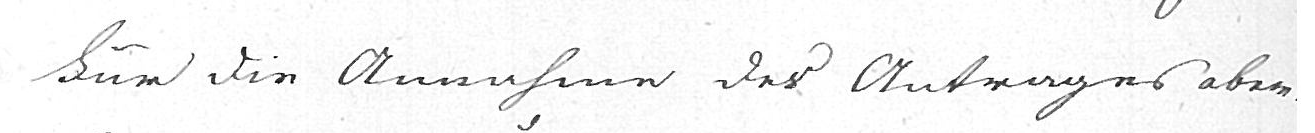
Für die Annahme des Antrages aber
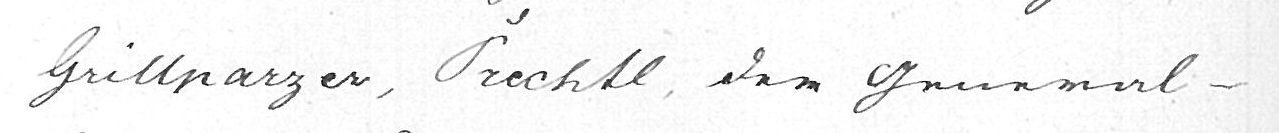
Grillparzer, Prechtl, der General-
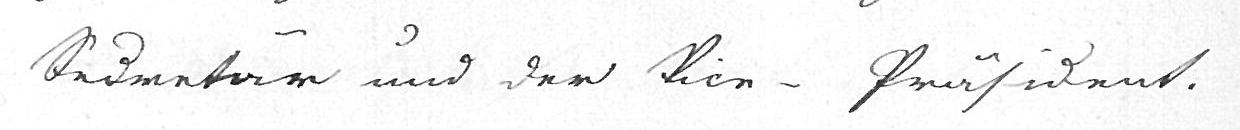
Secretär und der Vice-Präsident.
